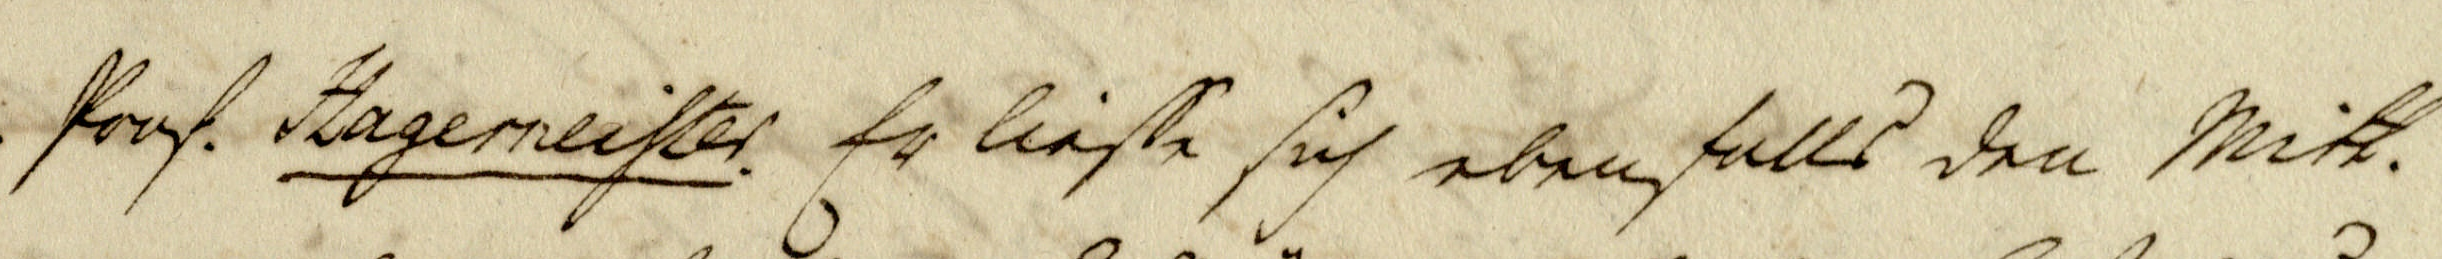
Prof. Hagemeister. Er liesse sich ebenfalls den Mitt¬
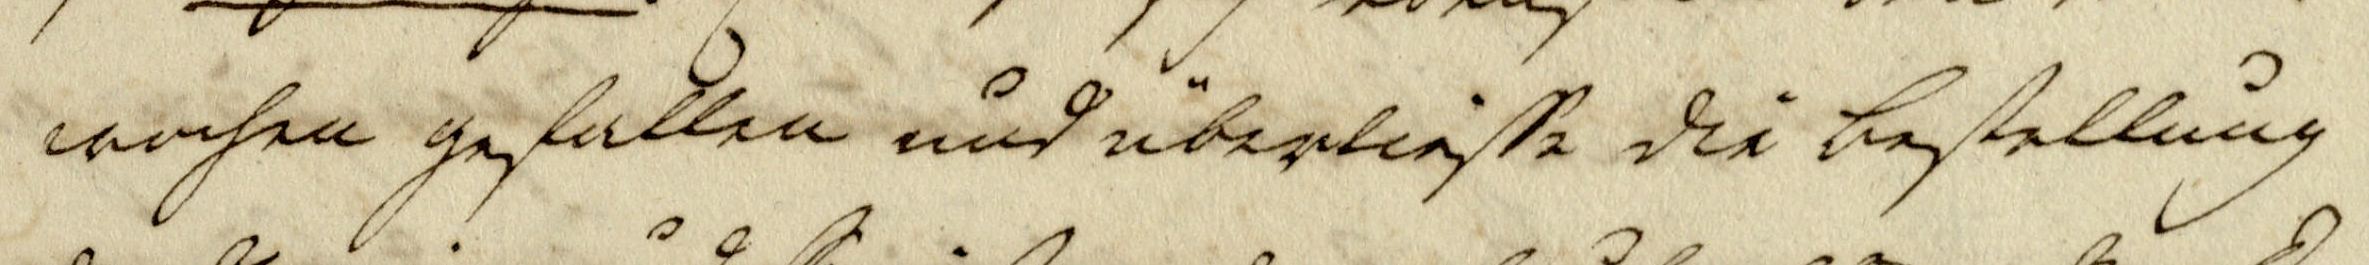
wochen gefallen und überliesse die Bestellung
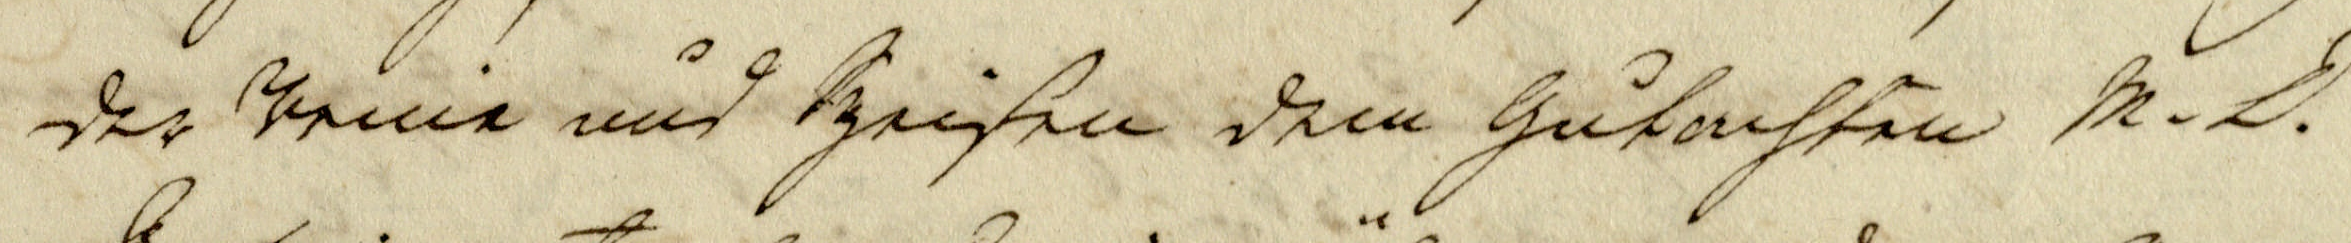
der Weine und Speisen dem Gutachten M. D.
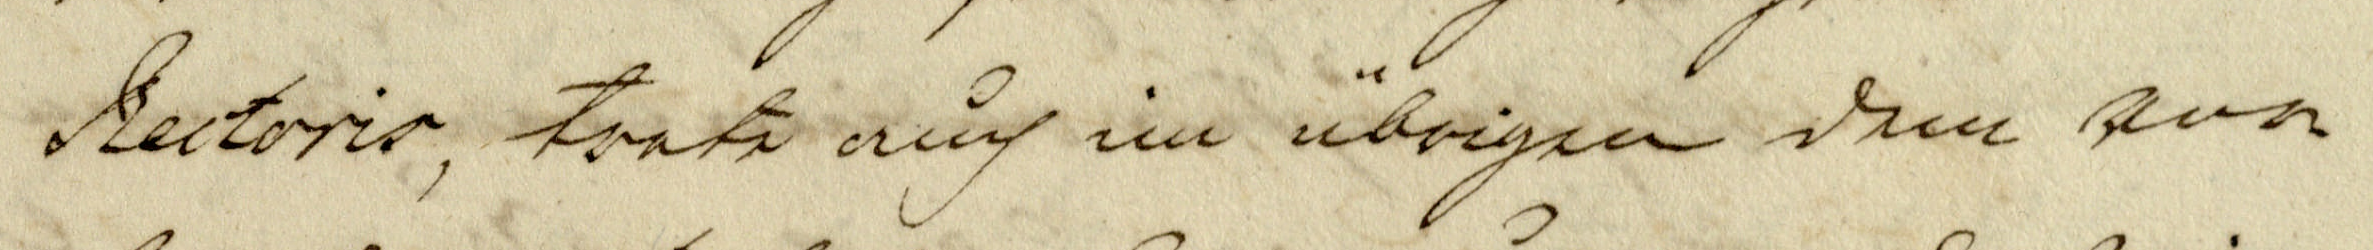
Rectoris, trete auch im übrigen dem vor¬
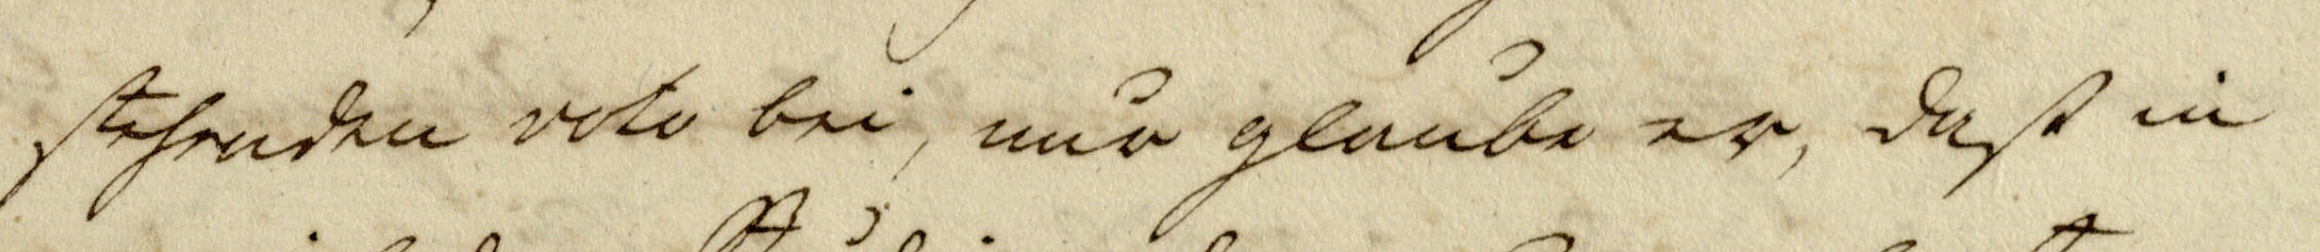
stehenden voto bei, nur glaube er, daß in
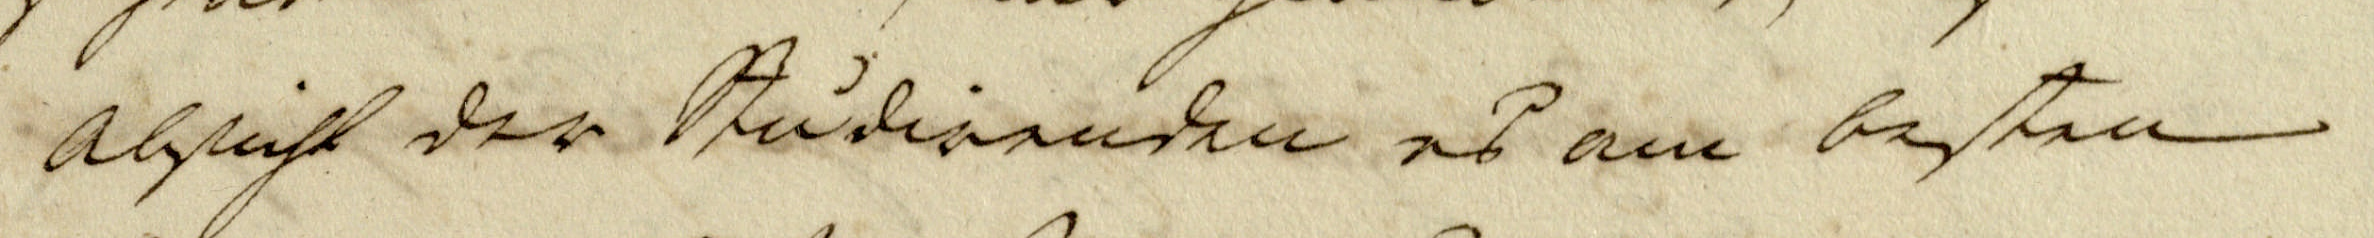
Absicht der Studirenden es am besten
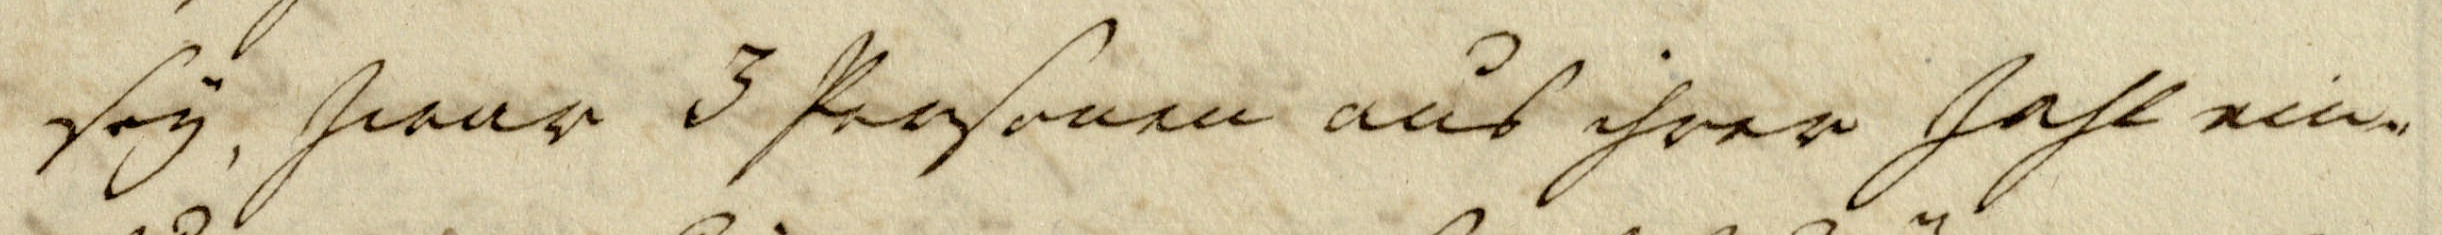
seÿ, zwar 3 Personen aus ihrer Zahl ein¬
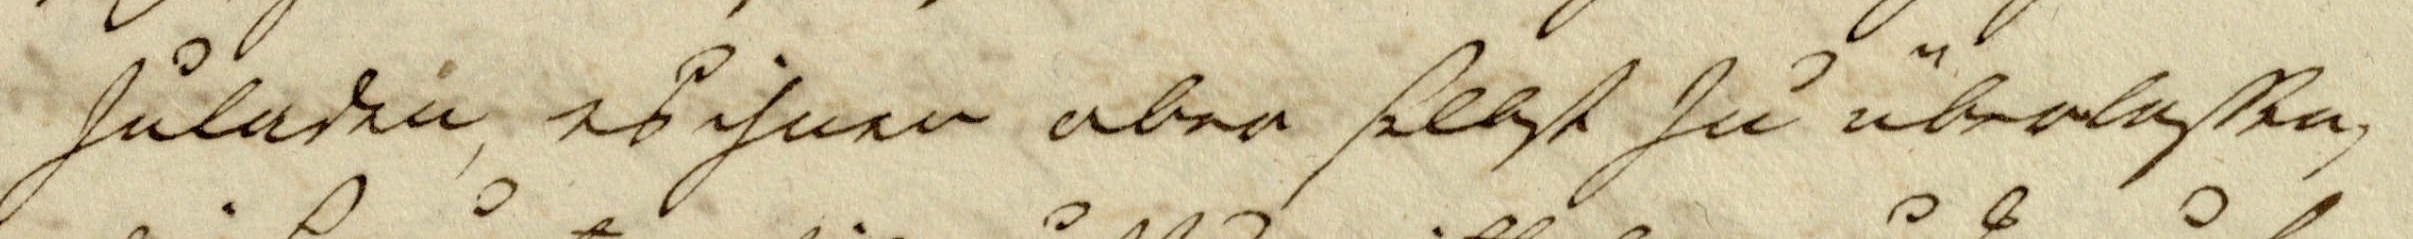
zuladen, es ihnen aber selbst zu überlassen,
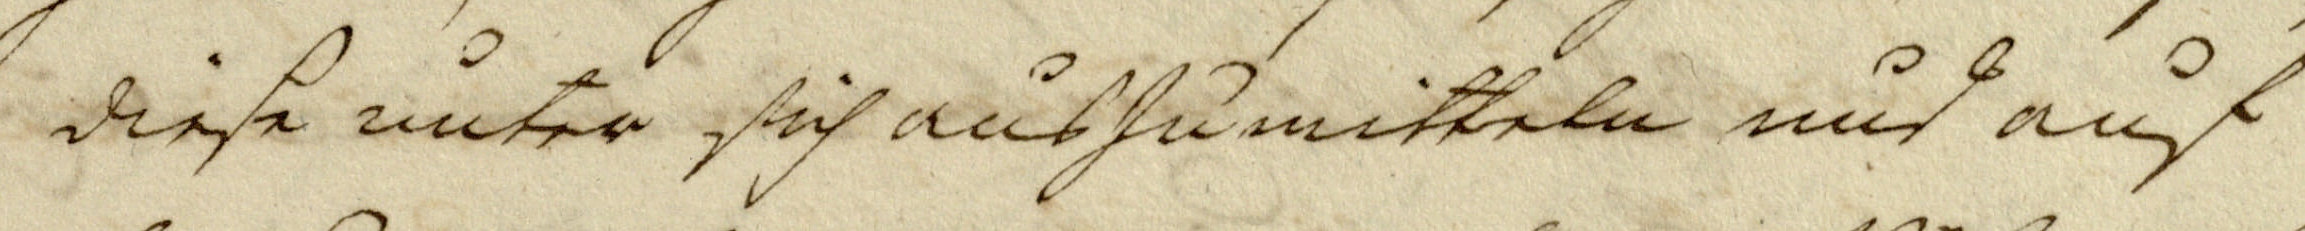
diese unter sich auszumitteln und auf
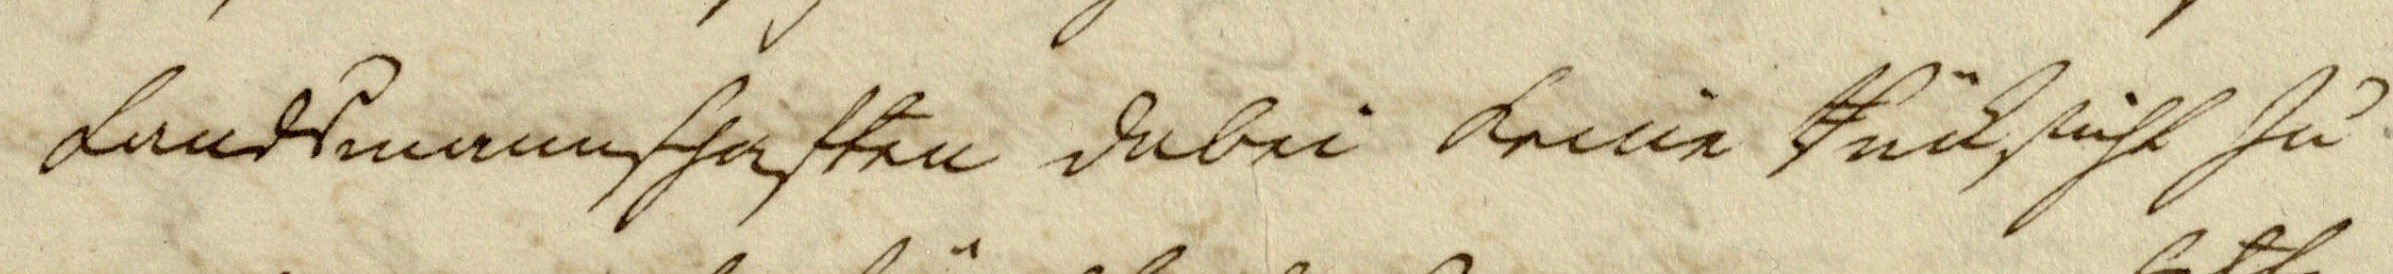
Landsmannschaften dabei keine Rücksicht zu
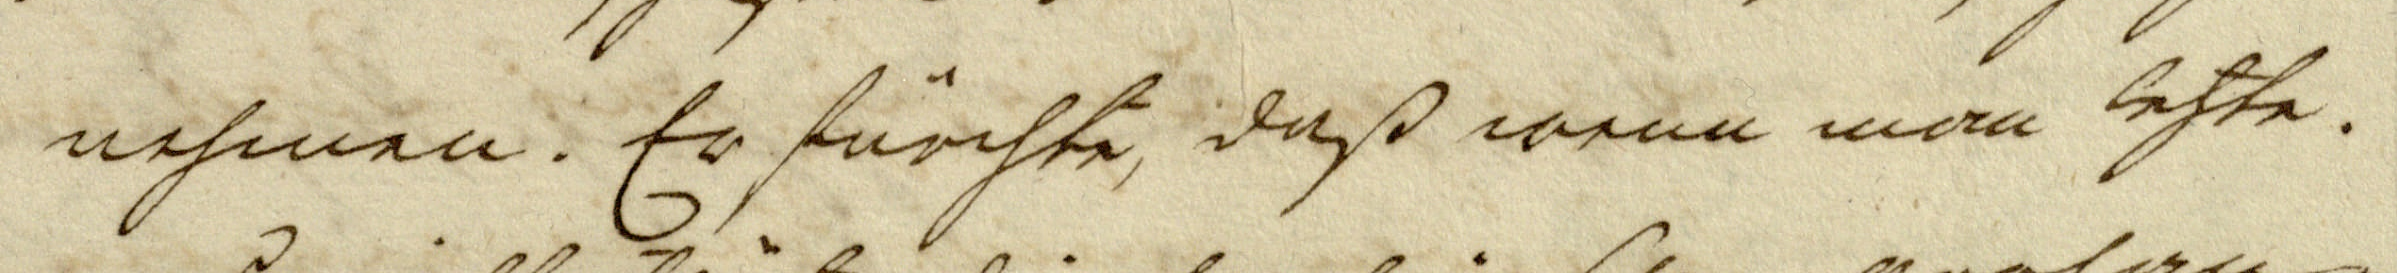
nehmen. Er fürchte, daß wenn man letzte¬
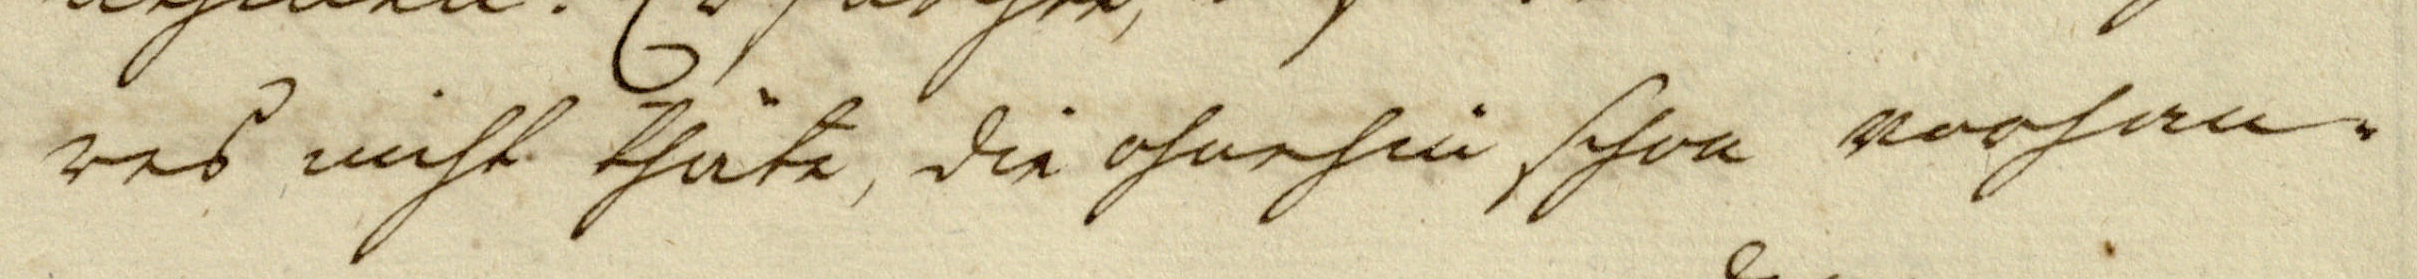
res nicht thäte, die ohnehin schon vorhan¬
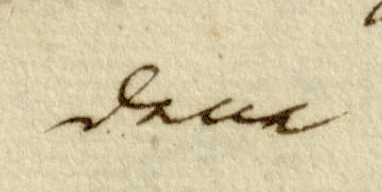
dene
